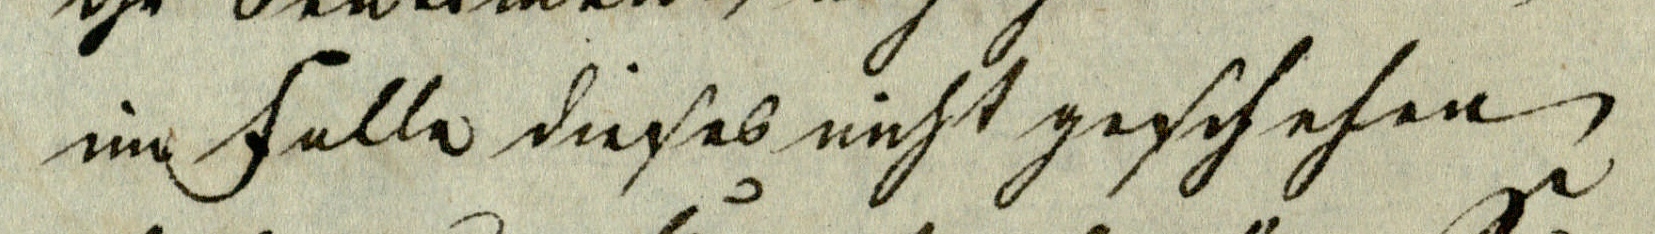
im Falle dieses nicht geschehen
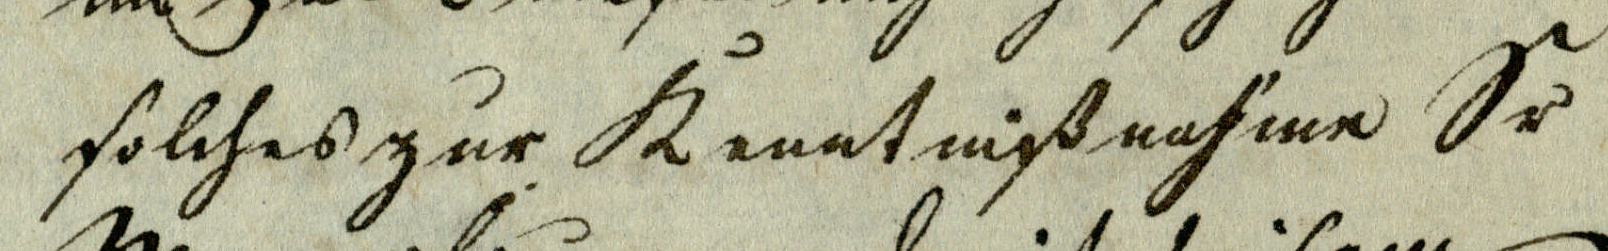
solches zur Kenntnißnahme Sr
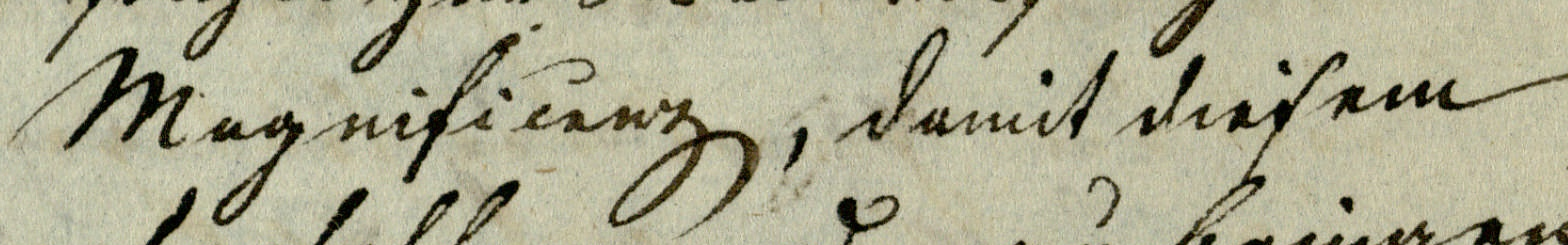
Magnificenz, damit diesem
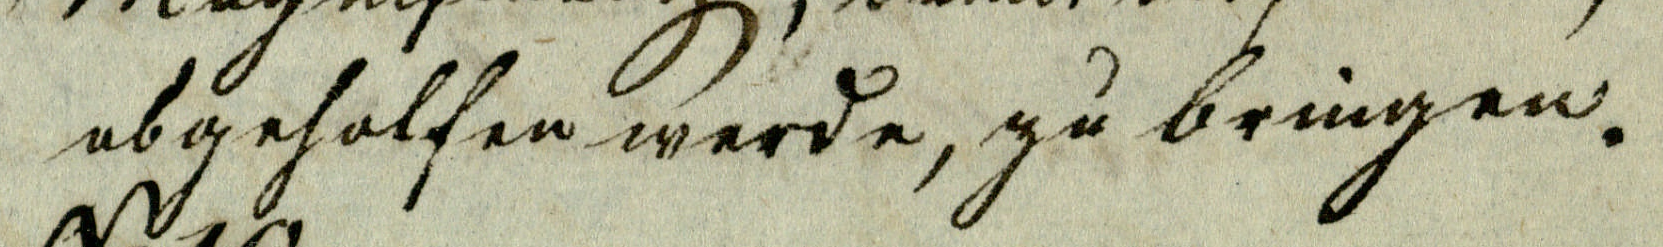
abgeholfen werde, zu bringen.
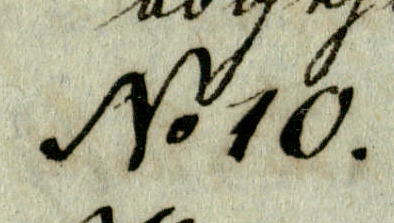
No 10.
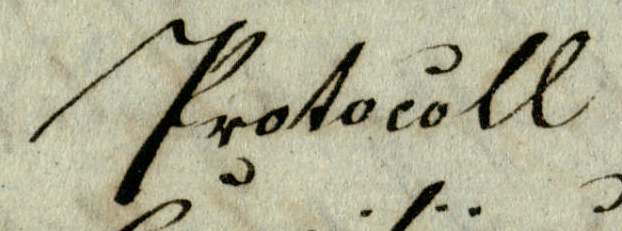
Protocoll
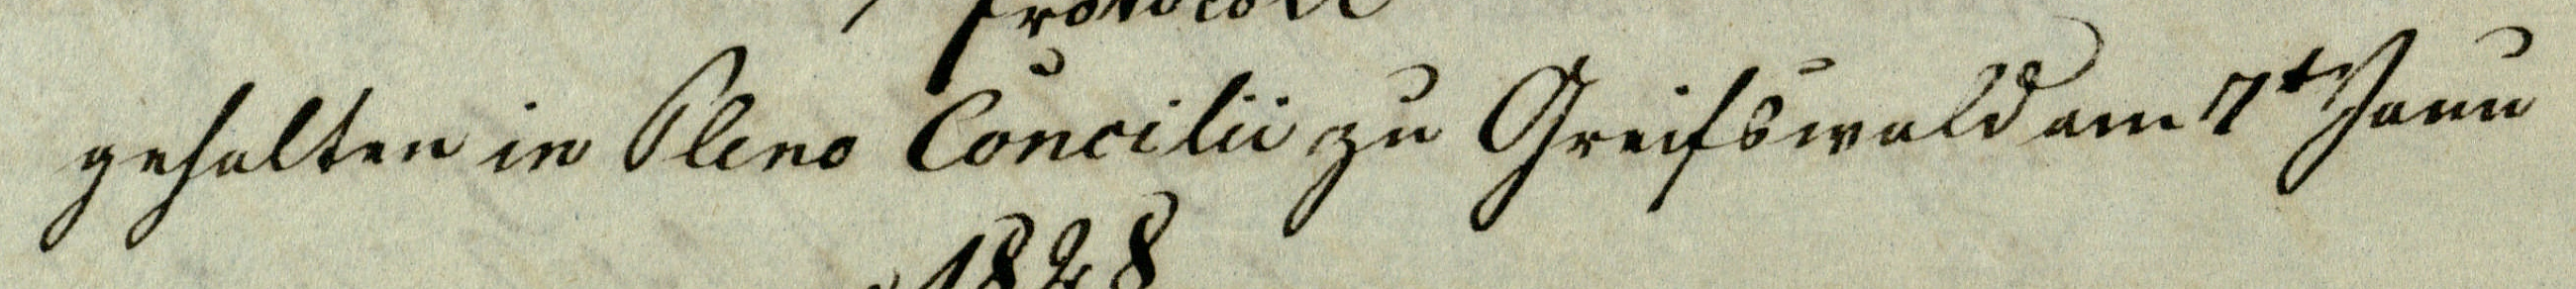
gehalten in Pleno Concilii zu Greifswald am 7ten Janu¬
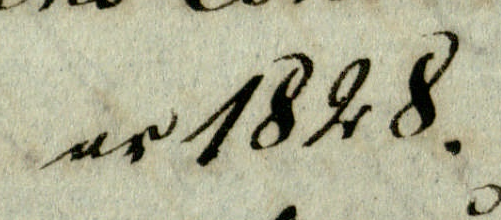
ar 1828.
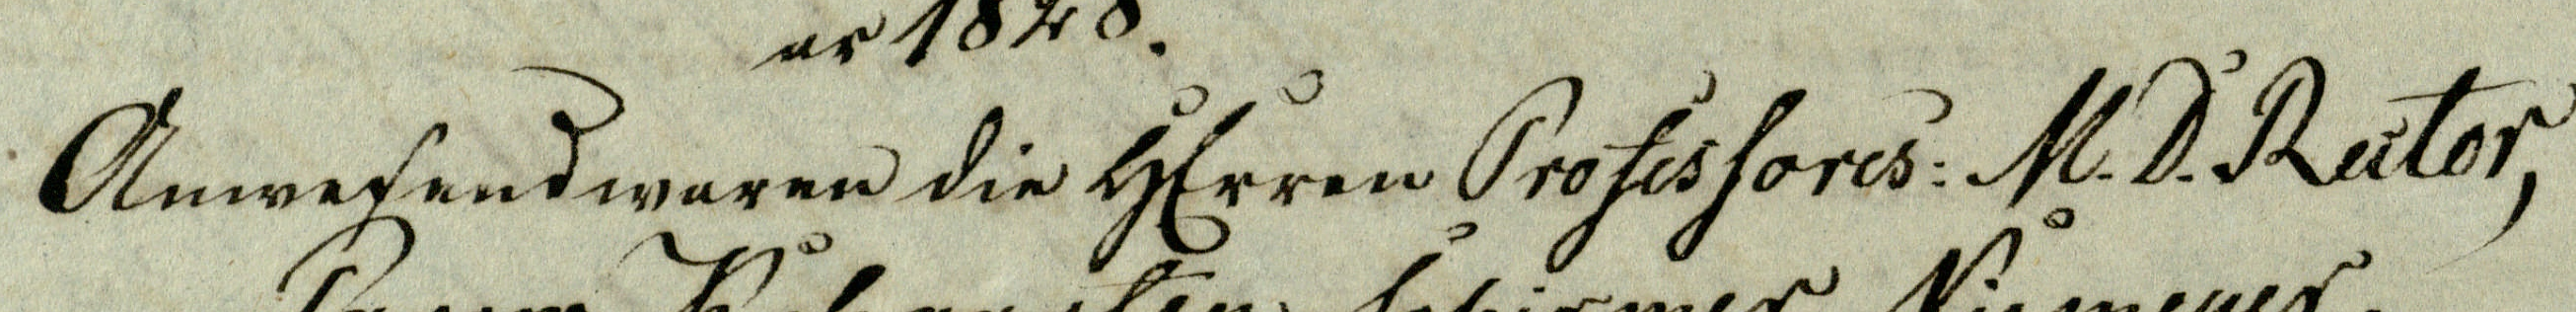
Anwesend waren die Herren Profesfores: M. D. Rector,
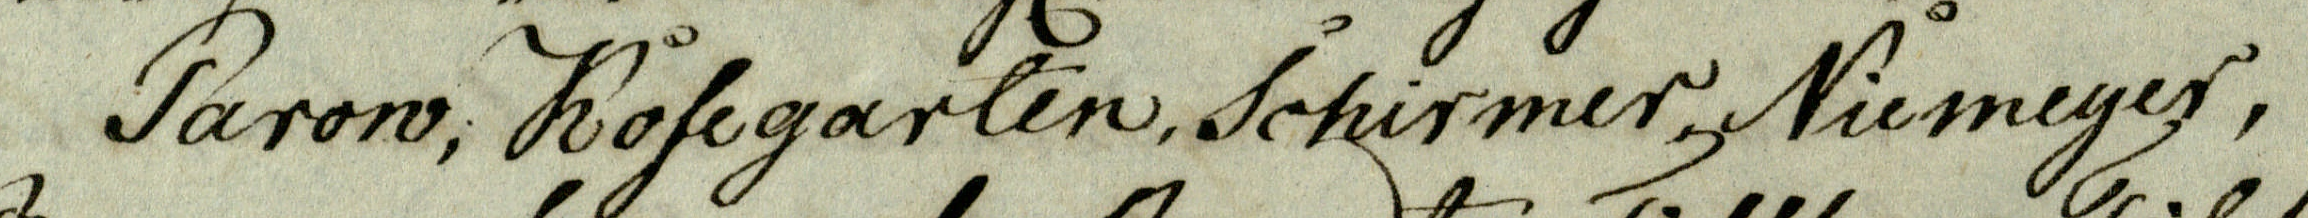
Parow, Kosegarten, Schirmer, Niemeyer,
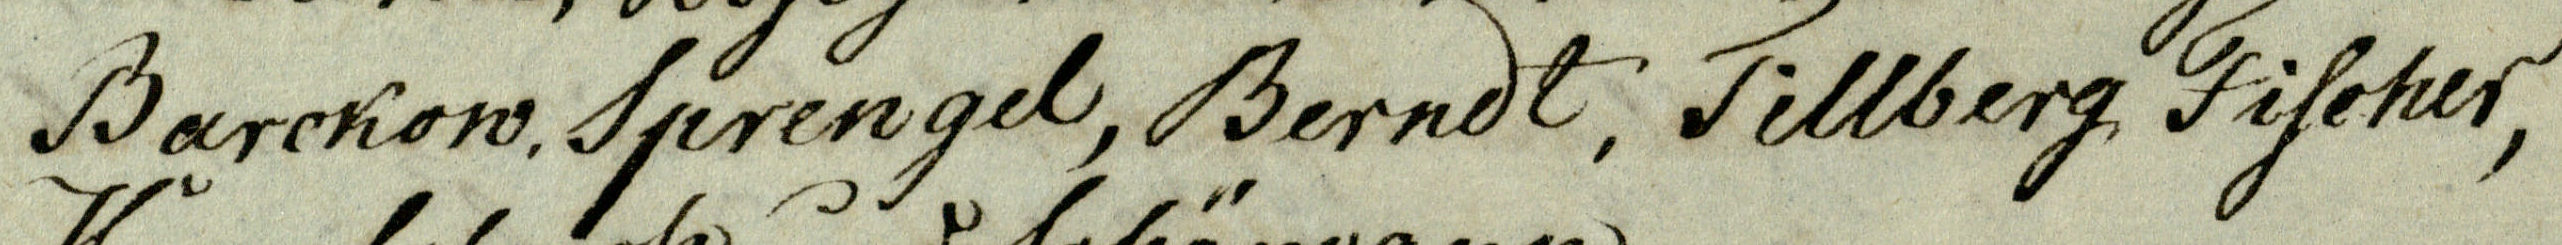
Barckow, Sprengel, Berndt, Tillberg, Fischer,
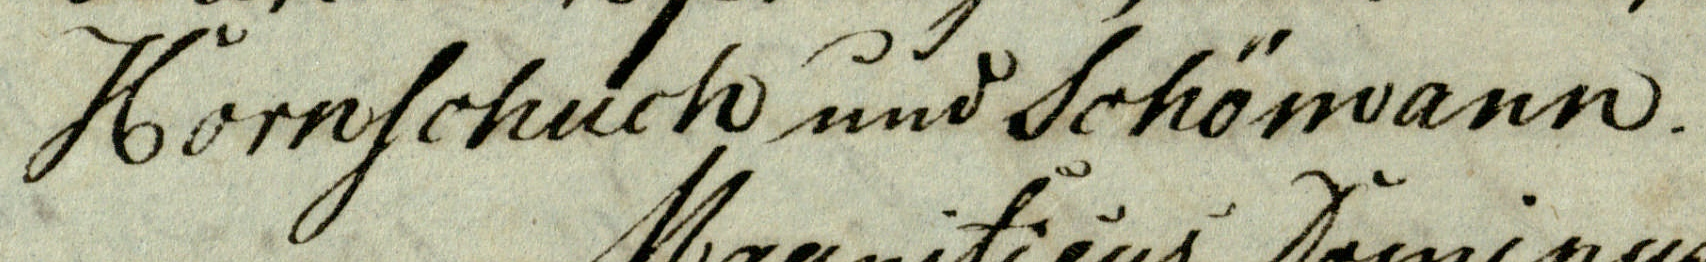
Hornschuch und Schömann.
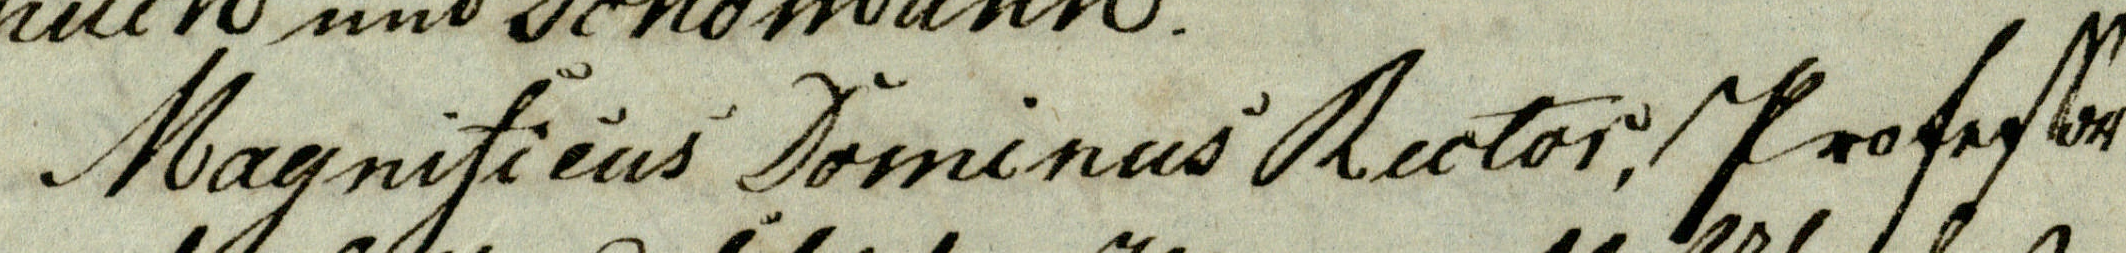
Magnificus Dominus Rector Professor
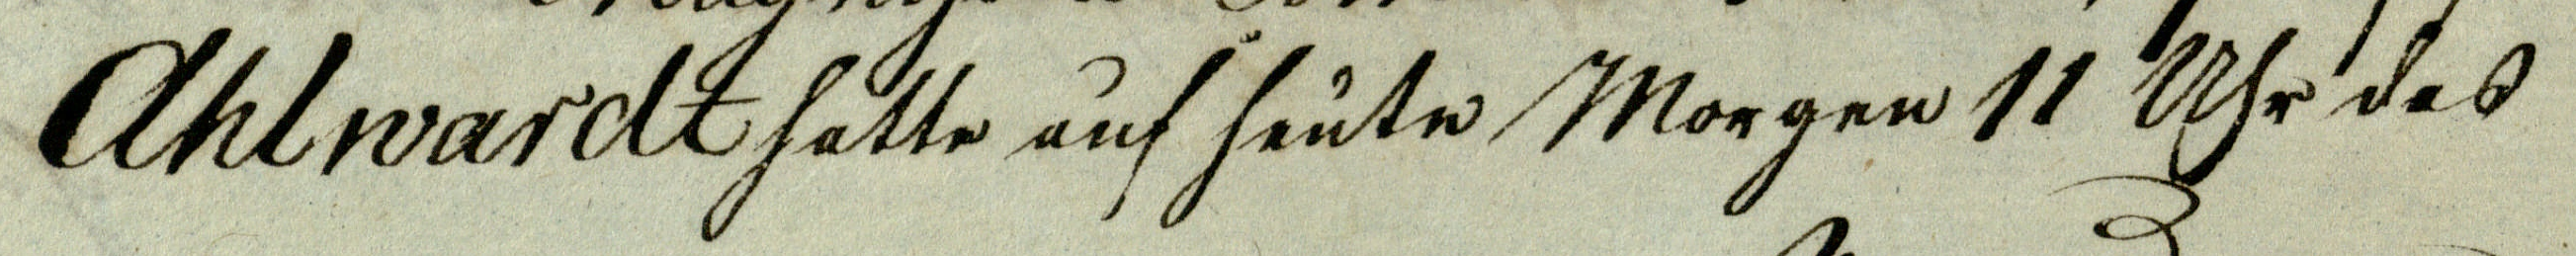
Ahlwardt hatte auf heute Morgen 11 Uhr das
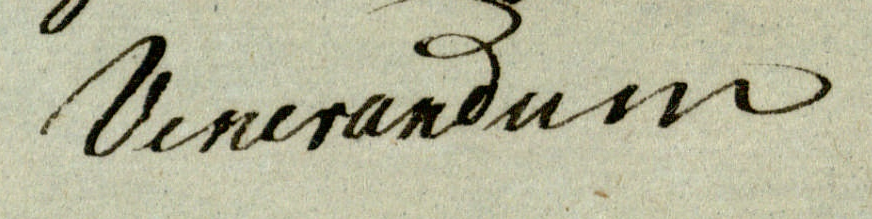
Venerandum
